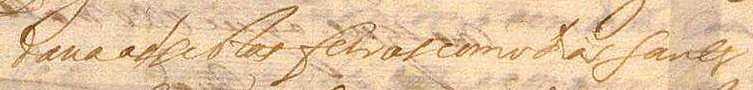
daua as sestas feiras como dias Santos
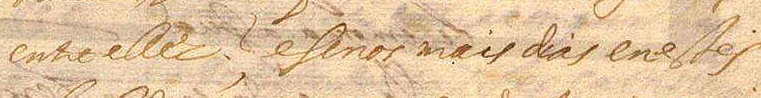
entre elles? e se nos mais dias en estes
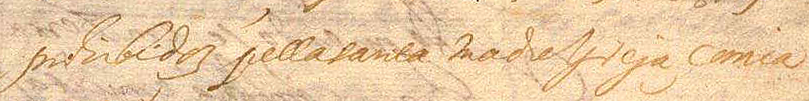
prohibidos pella santa madre Igreja, comia
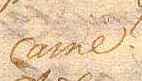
carne?
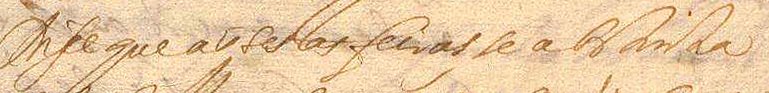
Disse que as sestas feiras se abstinha
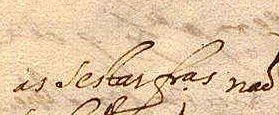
as sestas fr.as naõ
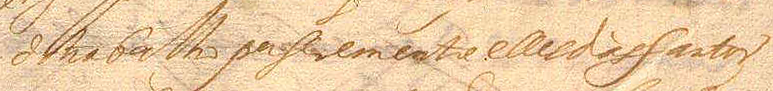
do trabalho por serem entre elles dias santos
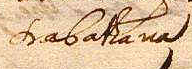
trabalhaua
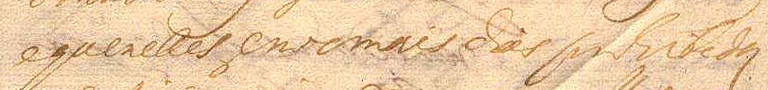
e que nelles e nos mais dias prohibidos
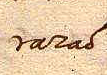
razaõ
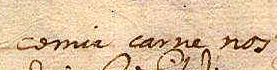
comia carne nos
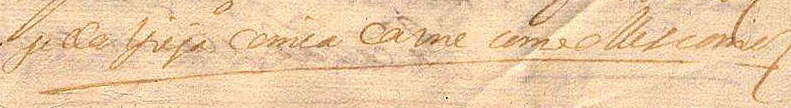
pella Igreja comia carne como elles comiā
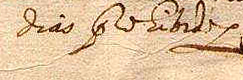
dias prohibidos
